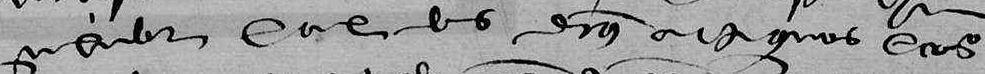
sabedor e al dos dīꝯ artiguos e caso
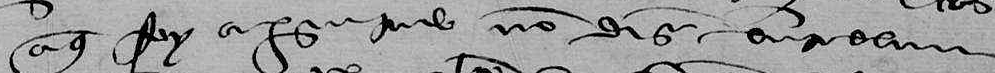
a q̄ foy aꝑsentado n̄o dise bertollameu
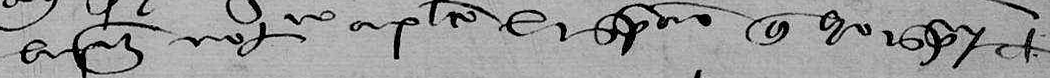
lopez notro apl̄co e esp̄ão q̄ ho esp̄uj
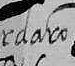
erdarō
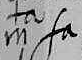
mta fa
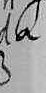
zda
